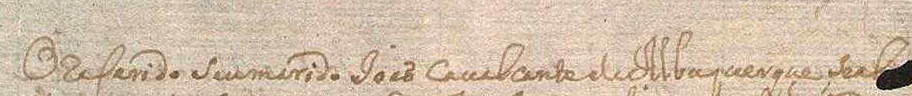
O Referido seu marido Ioaõ Caualcante de Albuquerque se al
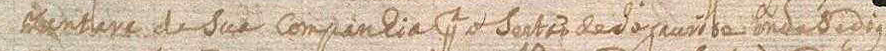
Zentara de sua companhia p.a o sertaõ da Sogauriba onde se diz
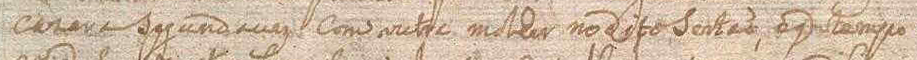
cazou a segunda uez com outra molher no dito sertaõ, e q̄ tempo
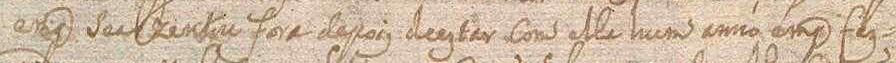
en q̄ se alzentou fora depois de eztar Com elle hum anno em q̄ fez
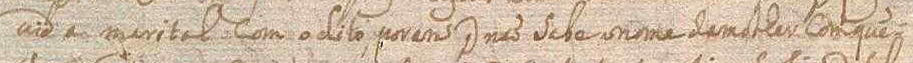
uida marital com o dito, porem q̄ naõ sabe o nome da molher com quē
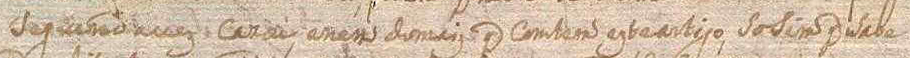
segunda uez cazou, e nem do maiz q̄ comtem este artigo, so sim q̄ sabe
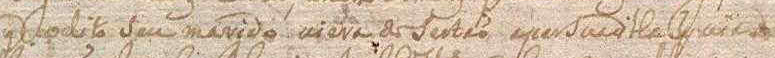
q̄ o dito seu marido uiera do Sertão a persuadilhe
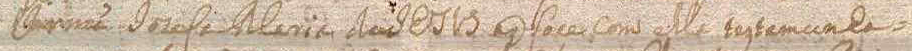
Irmã Iozefa Maria de IESVS q̄ foçe com ella testemunha
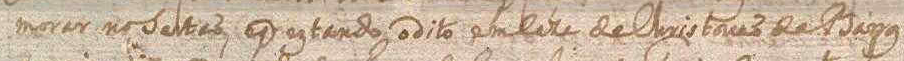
morar no Sertaõ, q̄ eztando o dito em Caza de Christouaõ de Barros
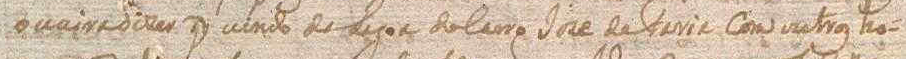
ouvira dizer q̄ uindo da Lagoa do Carro Ioze de Faria com outros ho
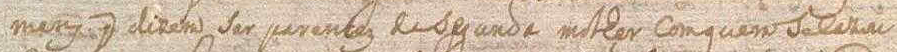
mens q̄ dizem ser parentez da segunda molher com quem se cazou
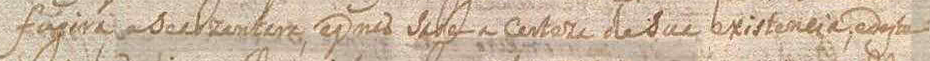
fugira e se alzentara, e q̄ naõ sabe a certeza de sua existencia, e dezte
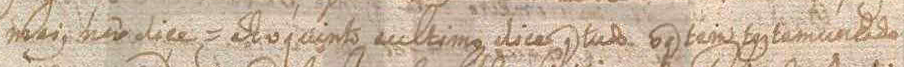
mais, naõ dice = Ao quinto e ultimo dice q̄ tudo o q̄ tem testemunhado
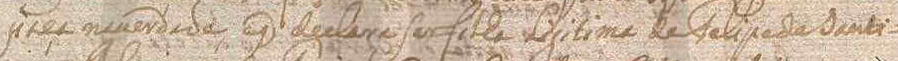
paça na uerdade, e q̄ declara ser filha Ligitima de Felipe de Santi
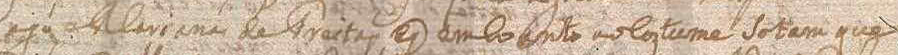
ago e Mariana de Freitas, e q̄ emCoanto ao Coztume so tem que
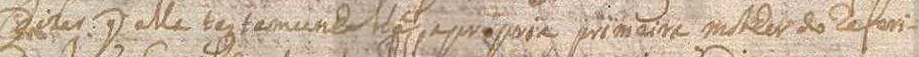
dizer q̄ ella testemunha Ma.er, a propria primeira molher do Referi
